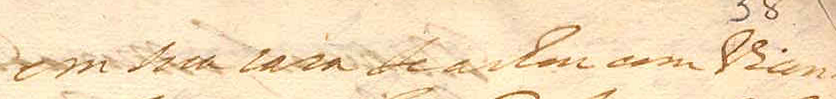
em sua casa se achou com Vicen
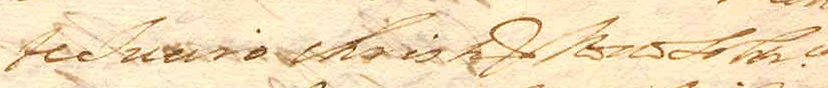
te Sueiro christaõ Nouo soltr.o
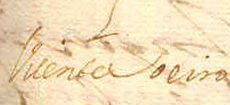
Vicente Soeiro
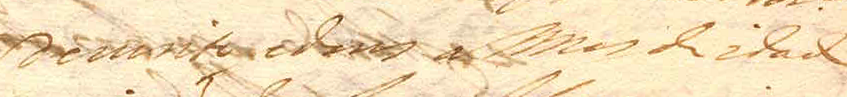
de uinte e dous annos de idade
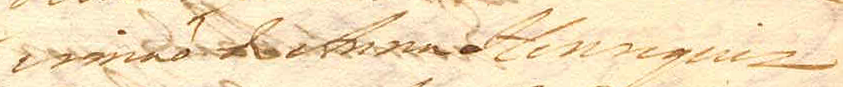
irmaõ de Anna Henriquez
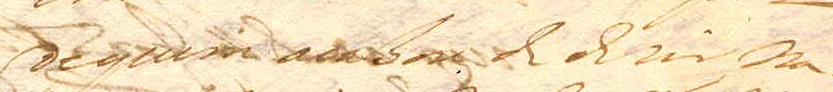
de quem acabou de dizer, na
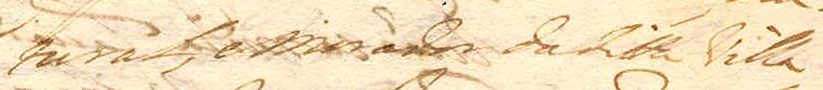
tural, e morador da dita Villa,
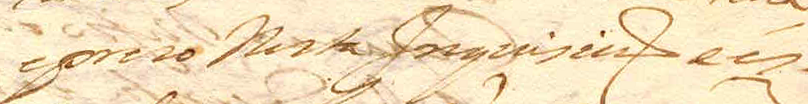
e prezo nesta Jnquisiçaõ e es
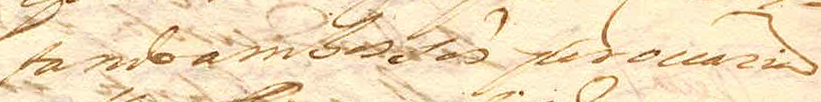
tando ambos sos̄ por occaziaõ
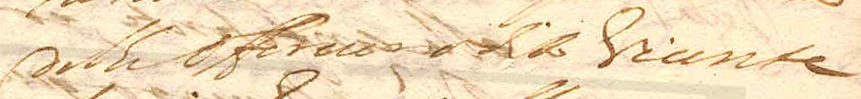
de lhe offerecer o dito Vicente
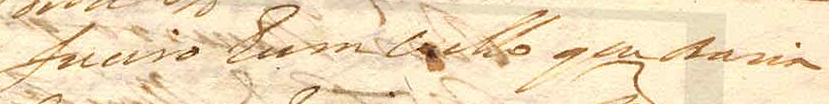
Sueiro hum coelho que trasia
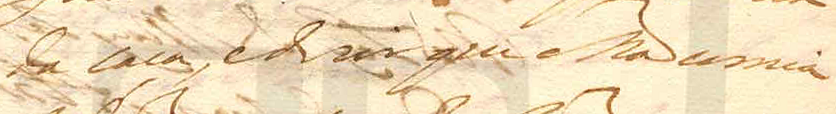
da caça, e dizer que o Nā comia
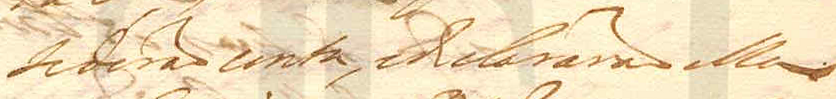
se derão conta, e declararaõ ella
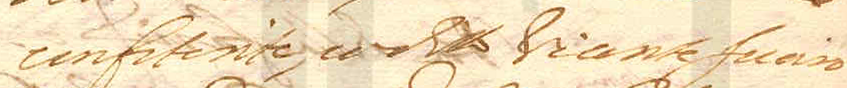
confitente, e o dito Vicente Sueiro
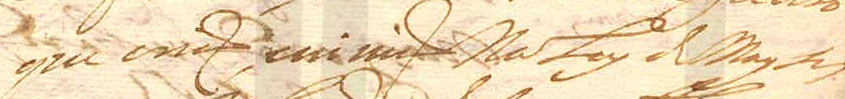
que criaõ, e uiuiaõ na Ley de Moyses
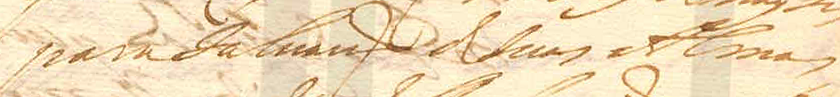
para saluaçaõ de suas Almas
